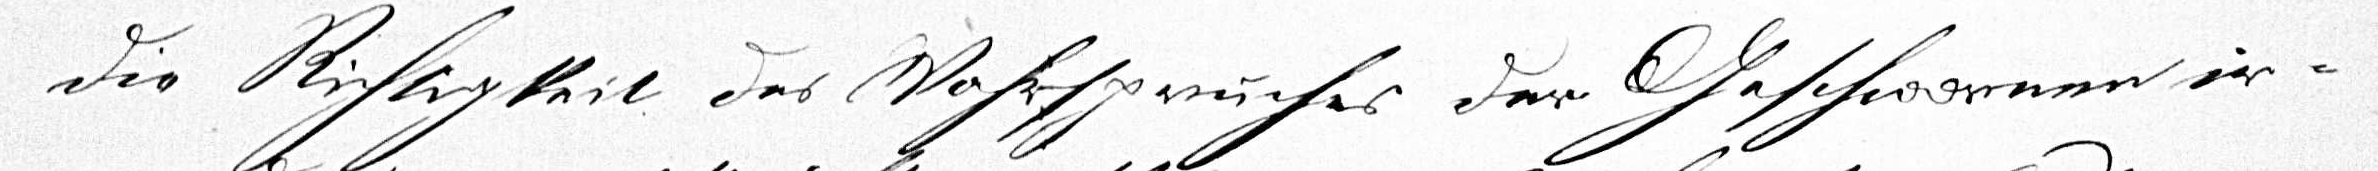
die Richtigkeit des Wahrspruches der Geschworenen ir¬
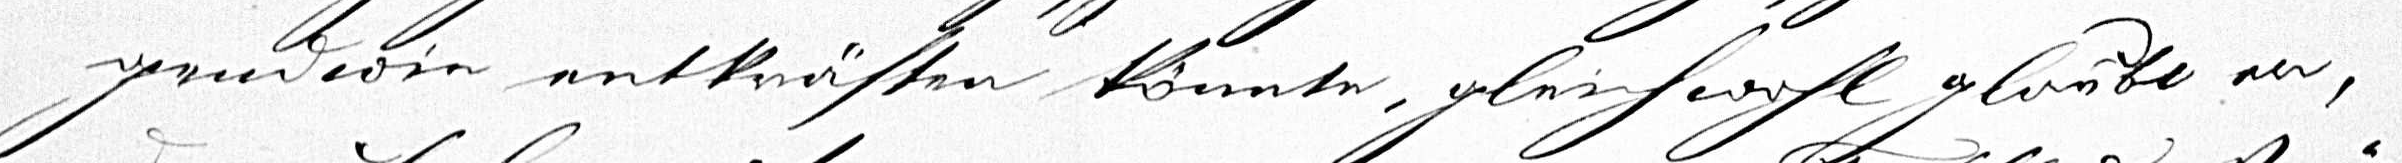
gendwie entkräften könnte, gleichwohl glaube er,
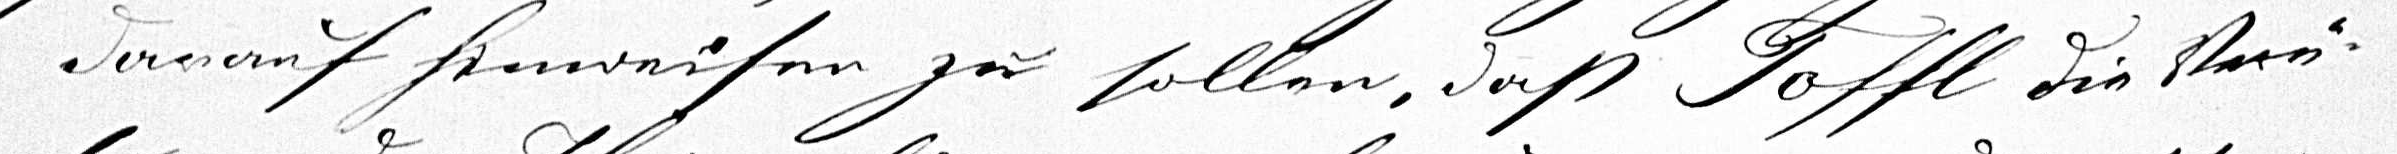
darauf hinweisen zu sollen, daß Toffl die Verü¬
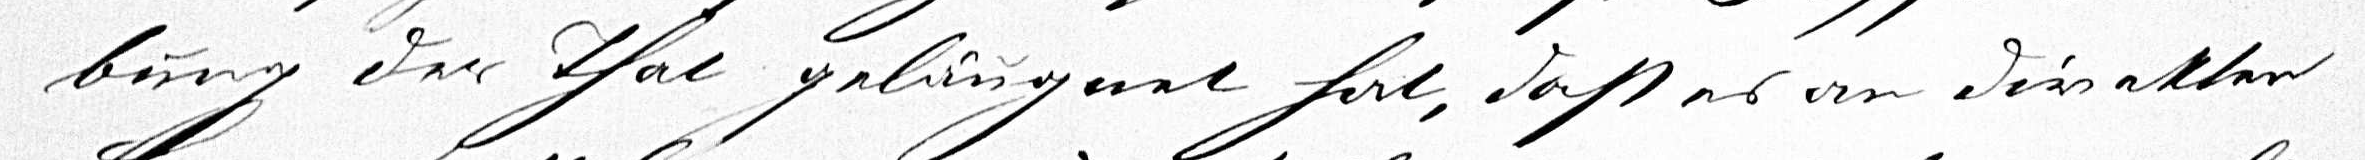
bung der That geläugnet hat, daß es an direkten
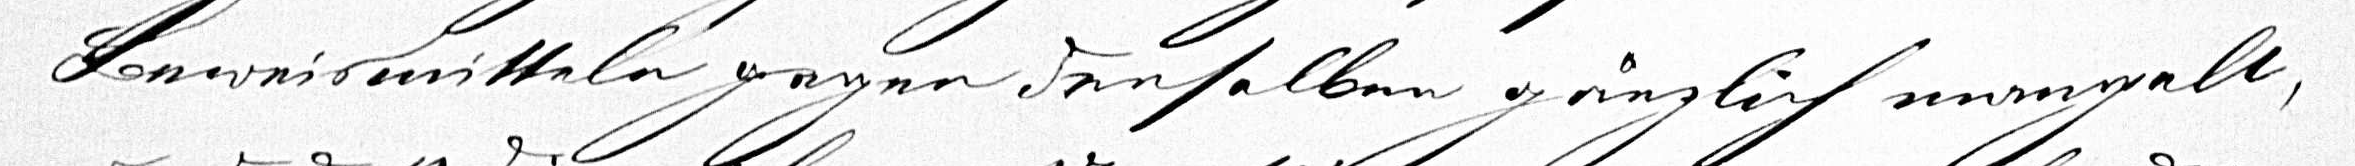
Beweismitteln gegen denselben gänzlich mangelt,
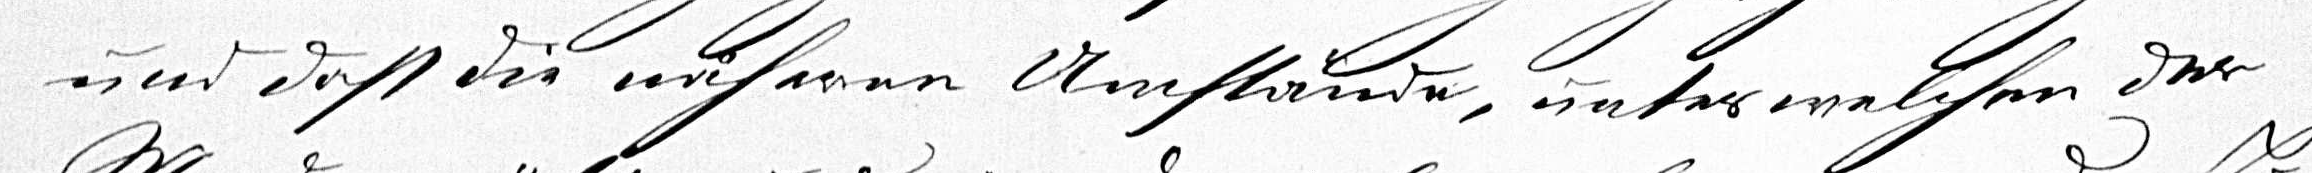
und daß die näheren Umstände, unter welchen der
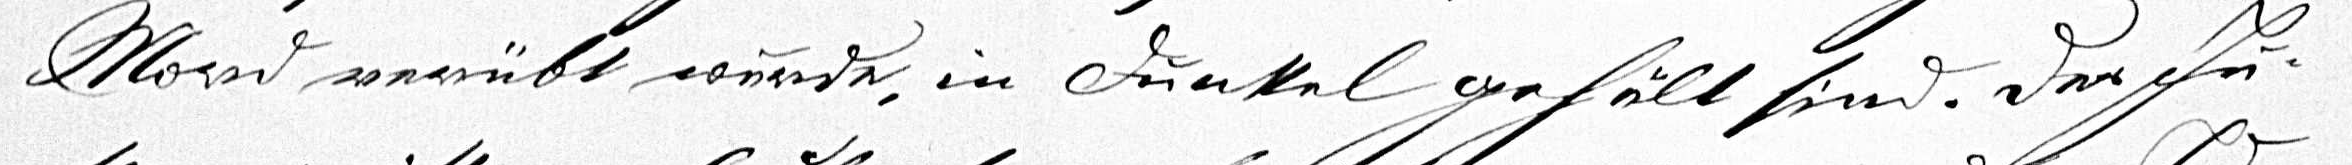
Mord verübt wurde, in Dunkel gehält sind. Der Ju¬
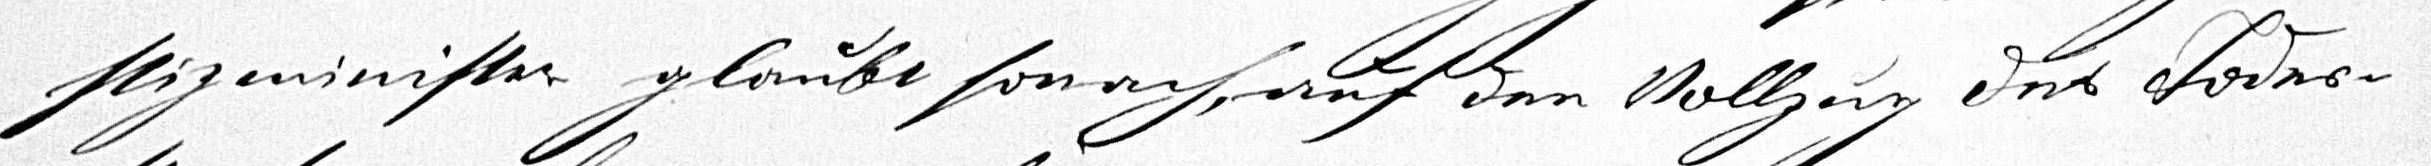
stizminister glaubt sonach, auf den Vollzug des Todes¬
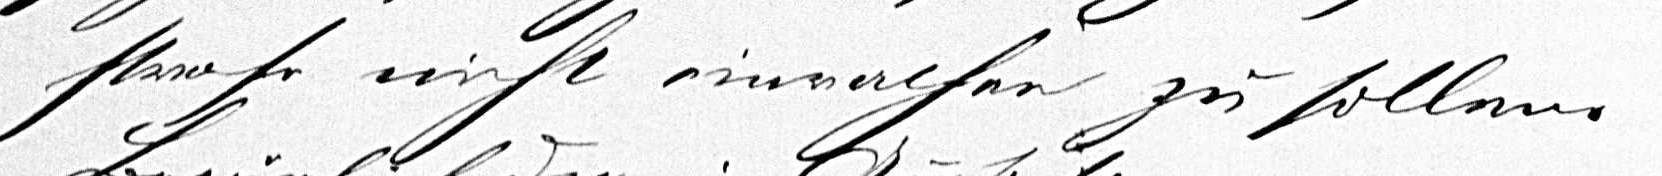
strafe nicht einrathen zu sollen.
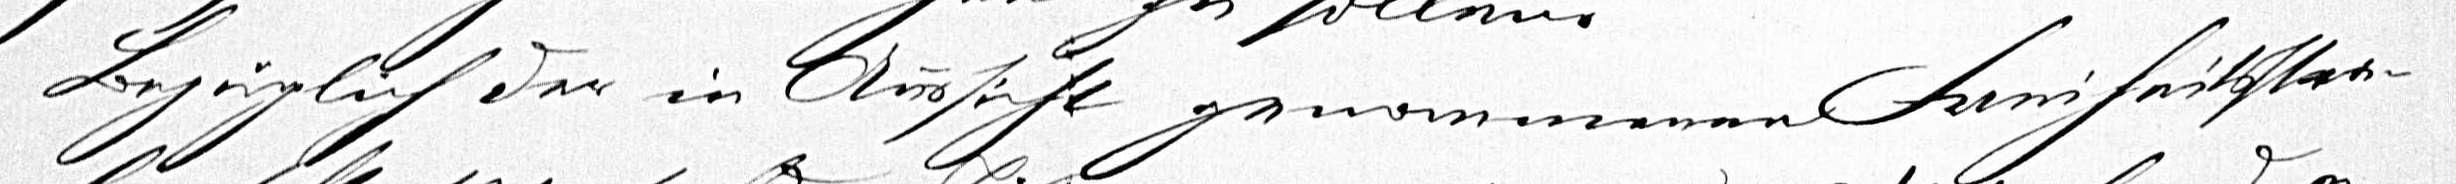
Bezüglich der in Aussicht genommenen Freiheitsstra¬
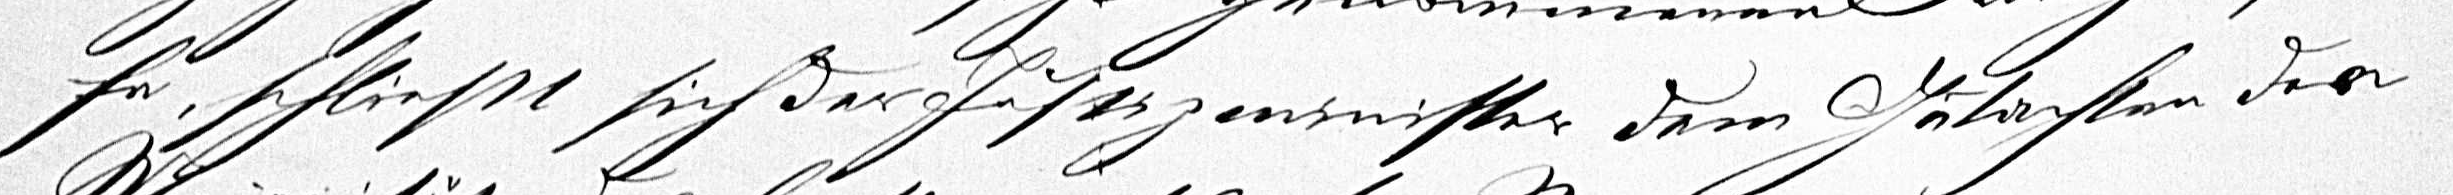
fe schließt sich der Justizminister dem Gutachten der
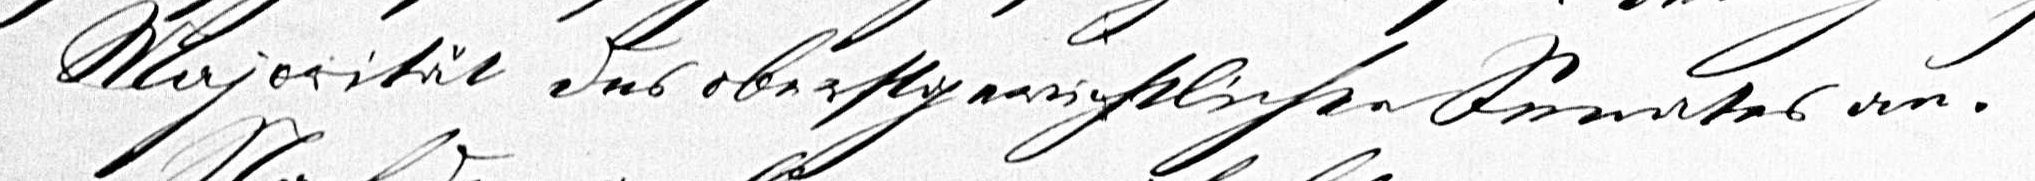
Majorität des oberstgerichtliche Senates an.
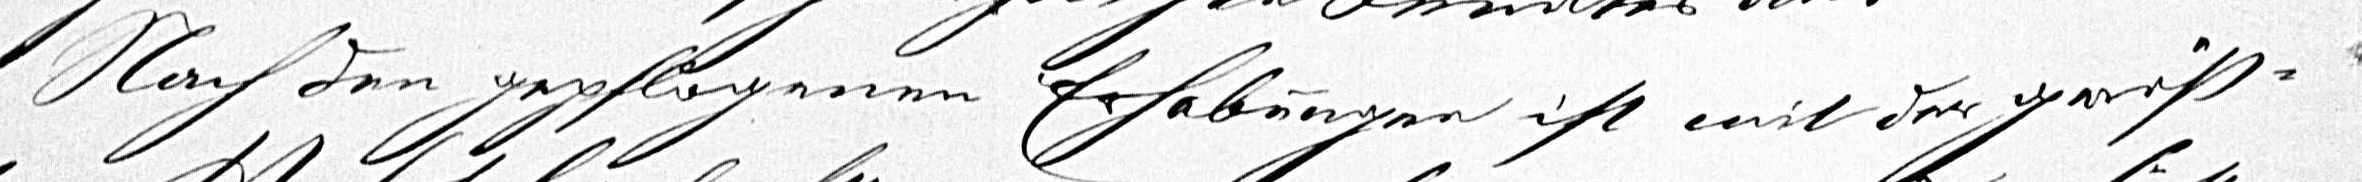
Nach den gepflogenen Erhebungen ist mit der größ¬
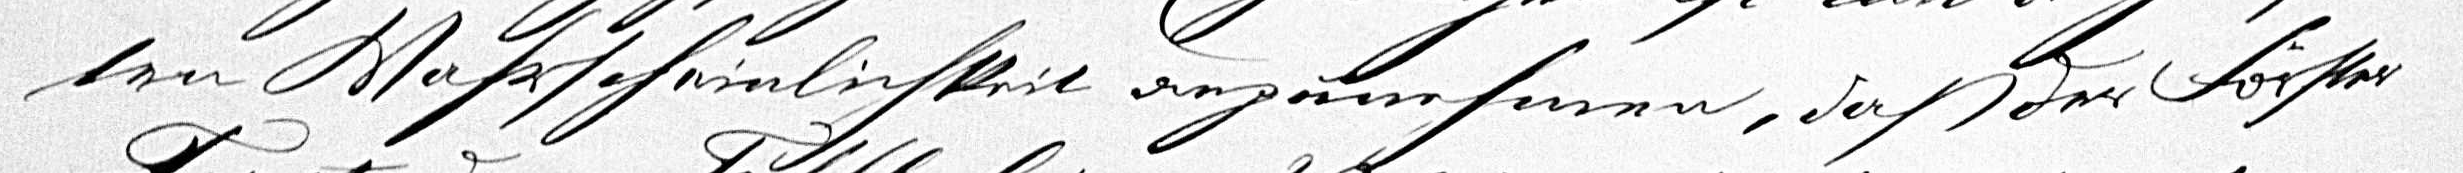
ten Wahrscheinlichkeit anzunehmen, daß der Förster
